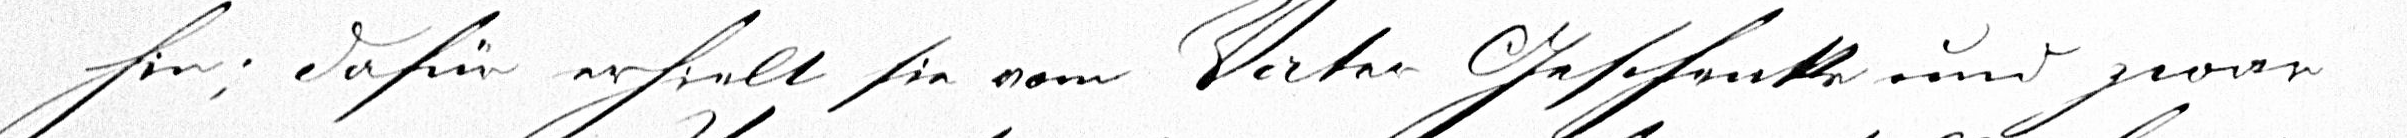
hin; dafür erhielt sie vom Vater Geschenke und zwar
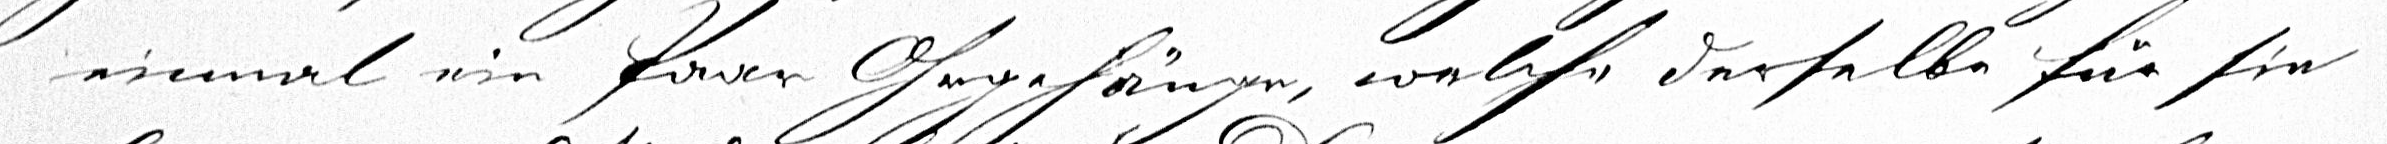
einmal ein Paar Ohrgehänge, welche derselbe für sie
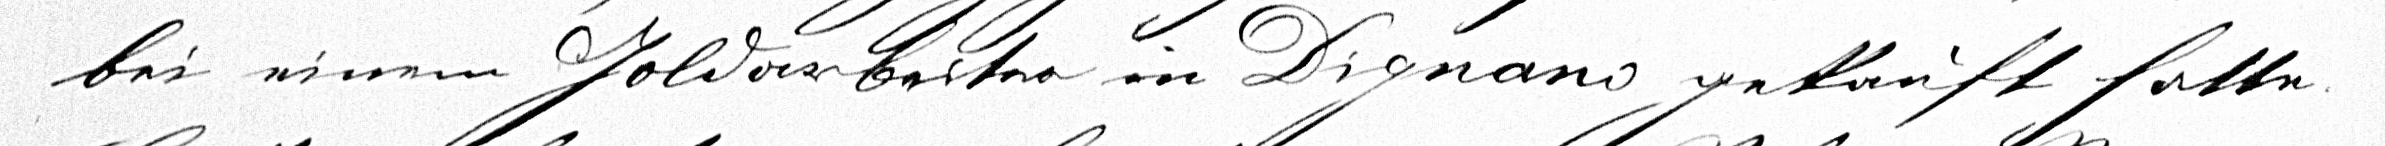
bei einem Goldarbeiter in Dignano gekauft hatte.
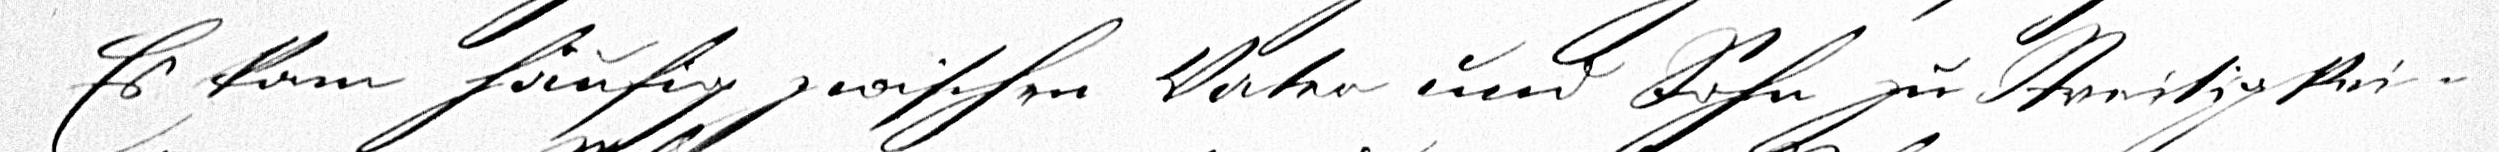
Es kam häufig zwischen Vater und Sohn zu Streitigkei¬
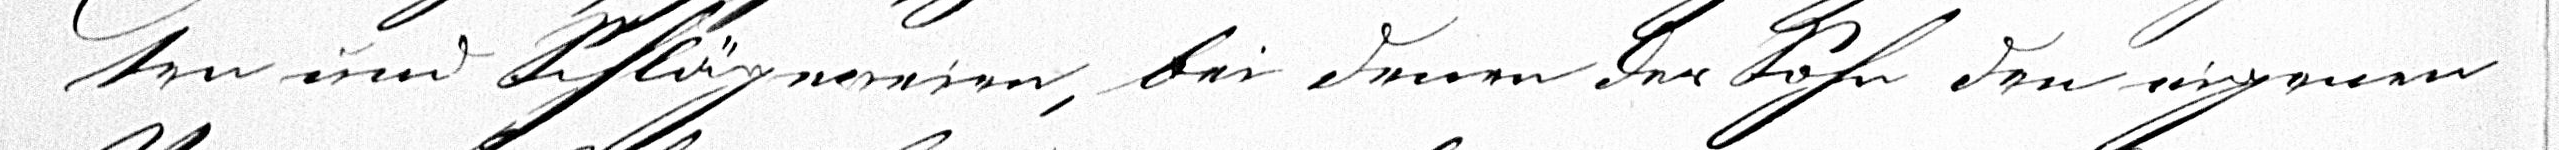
ten und Schlägereien, bei denen der Sohn den eigenen
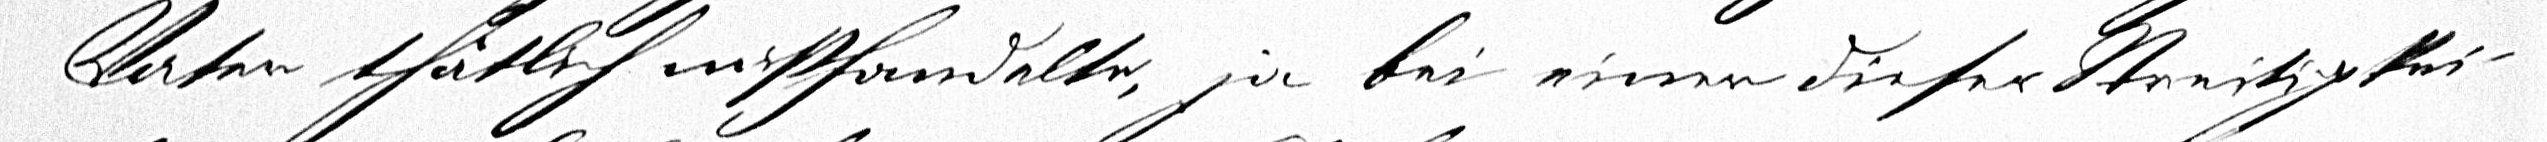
Vater thätlich mißhandelte, ja bei einen dieser Streitigkei¬
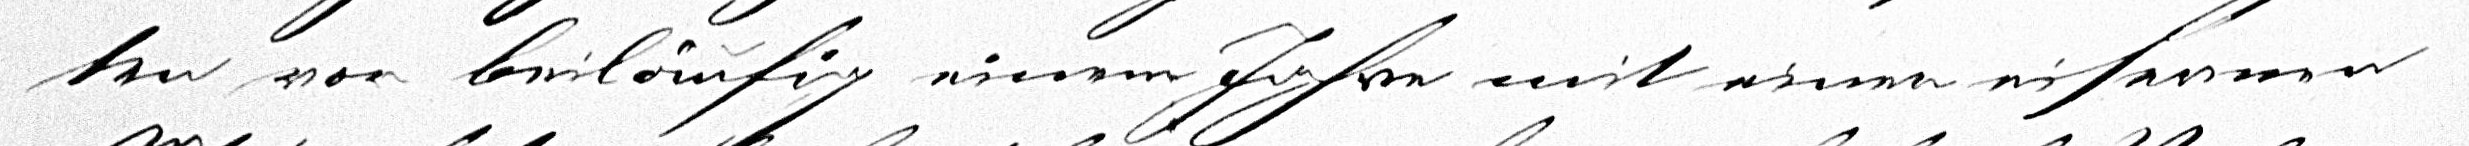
ten vor beiläufig einem Jahre mit einen eisernen
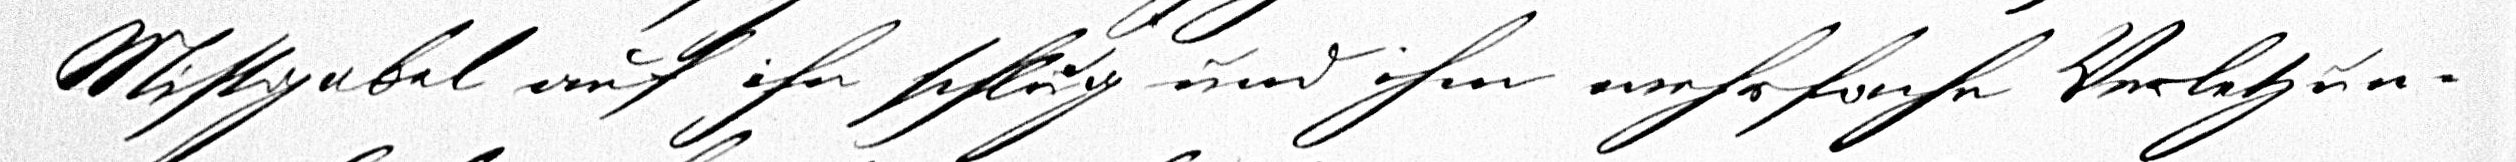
Mistgabel auf ihn schlug und ihm mehrfache Verletzun¬
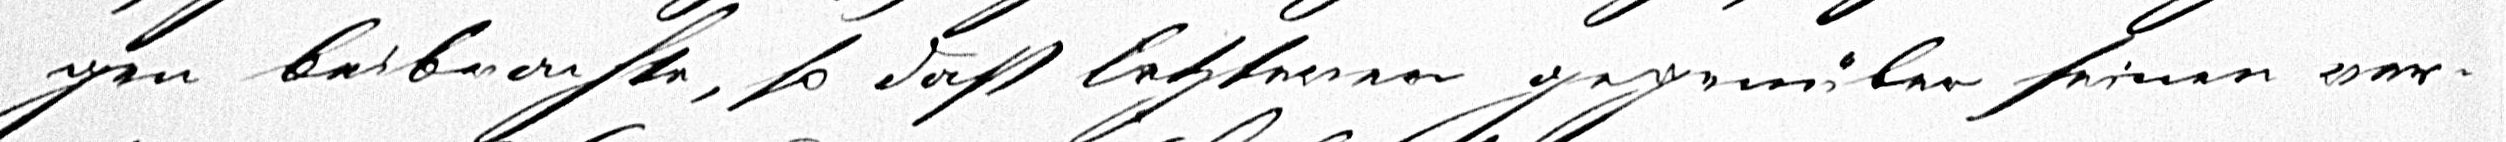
gen beibrachte, so daß letzterer gegenüber seinen ver¬
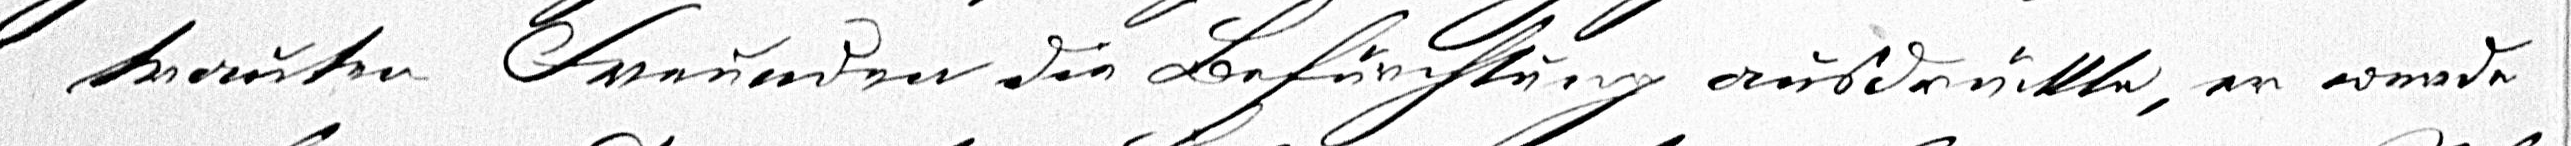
trauten Freunden die Befürchtung ausdrückte, er wurde
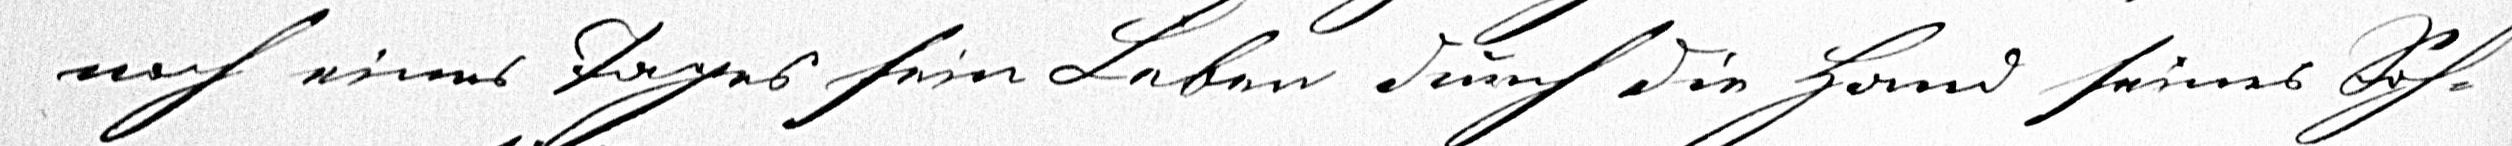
noch eines Tages sein Leben durch die Hand seines Soh¬
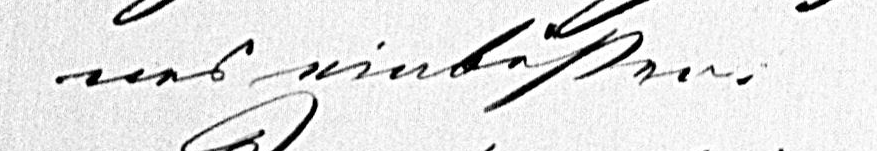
nes einbüßen.
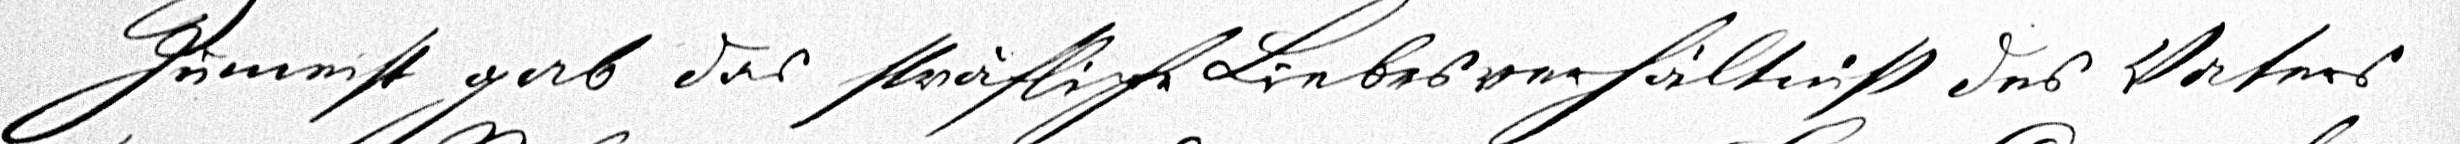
Zumeist gab das sträfliche Liebesverhältniß des Vaters
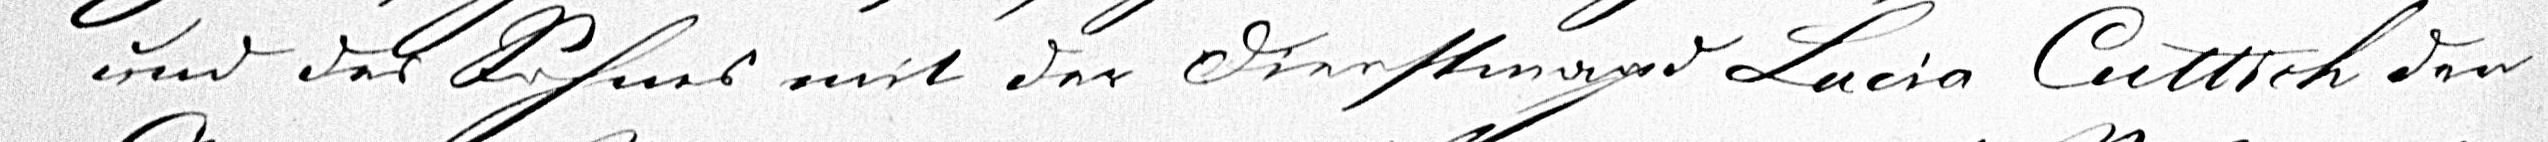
und Sohnes mit der Dienstmagd Lucia Cuttich der
